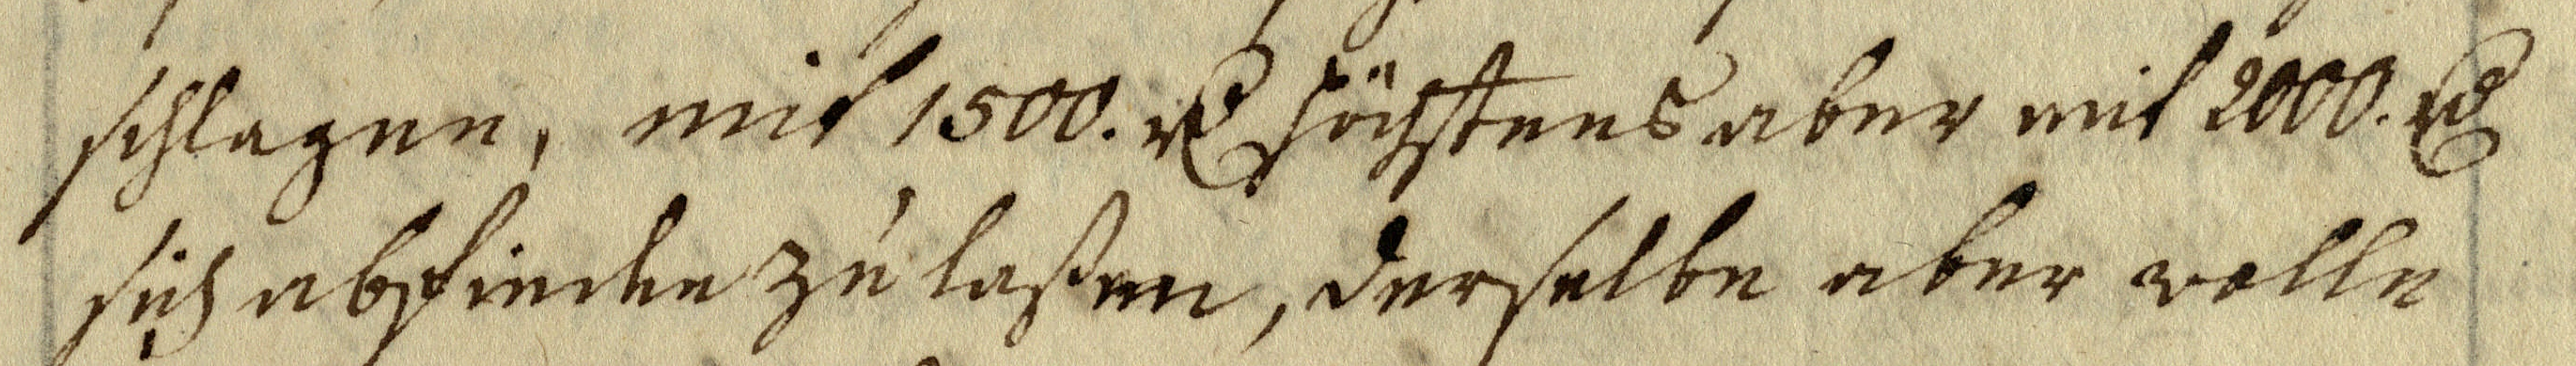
schlagen, mit 1500. rl. höchstens aber mit 2000. rl.
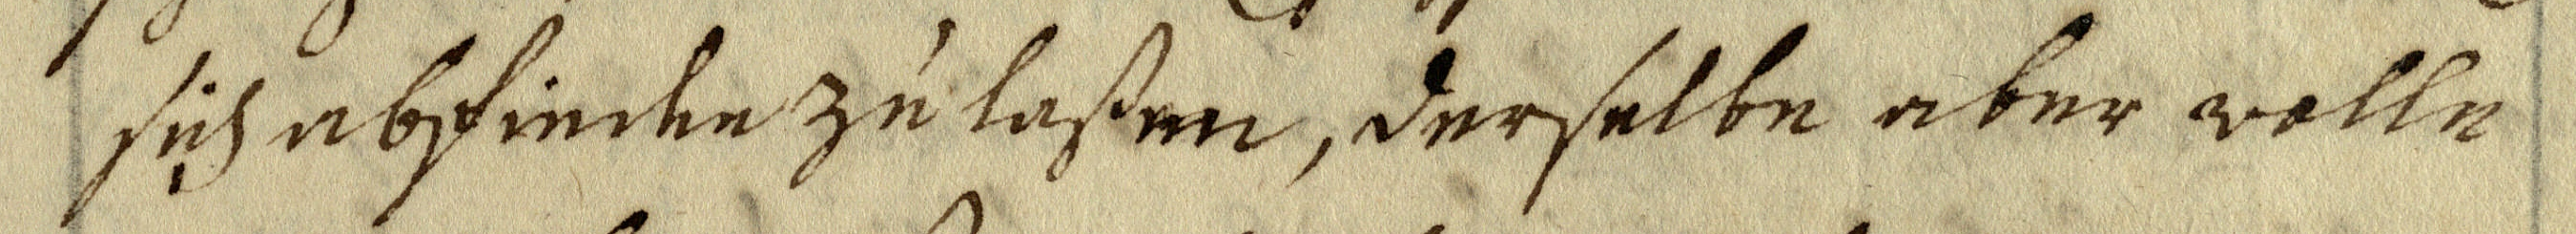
sich abfinden zu laßen, derselbe aber wolle
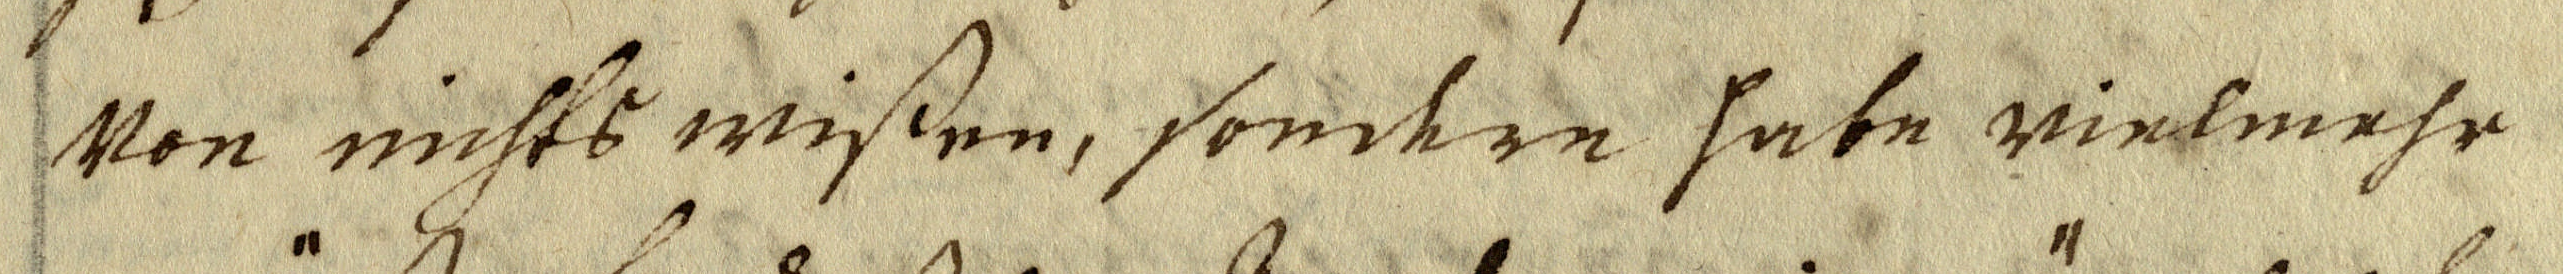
von nichts wißen, sondern habe vielmehr
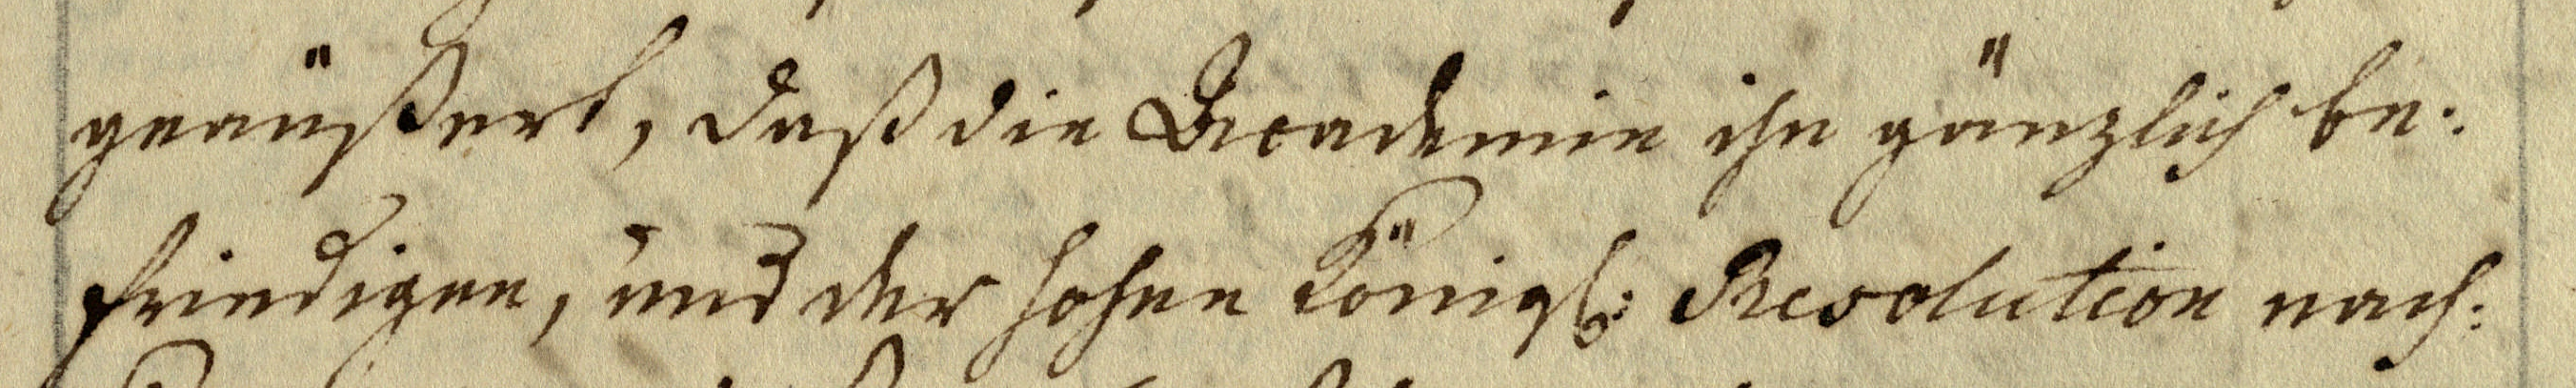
geäußert, daß die Academie ihn gänzlich be¬
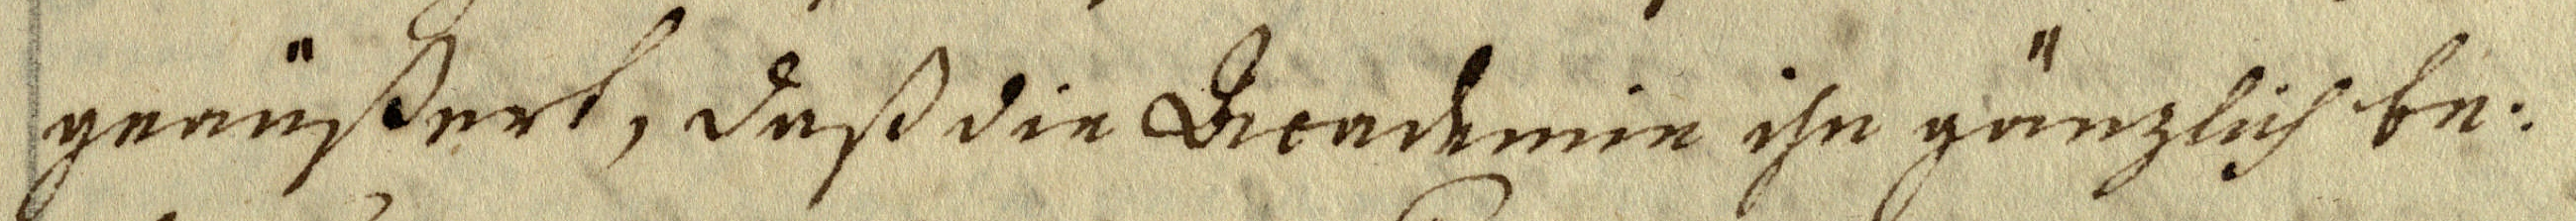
friedigen, und der hohen Königl. Resolution nach¬
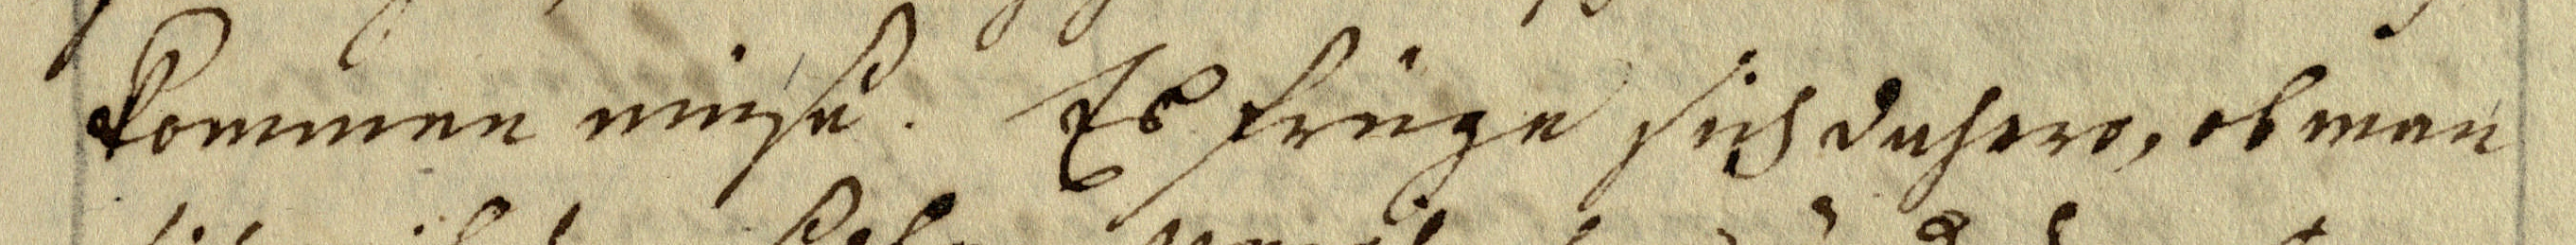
kommen müße. Es früge sich dahero, ob man
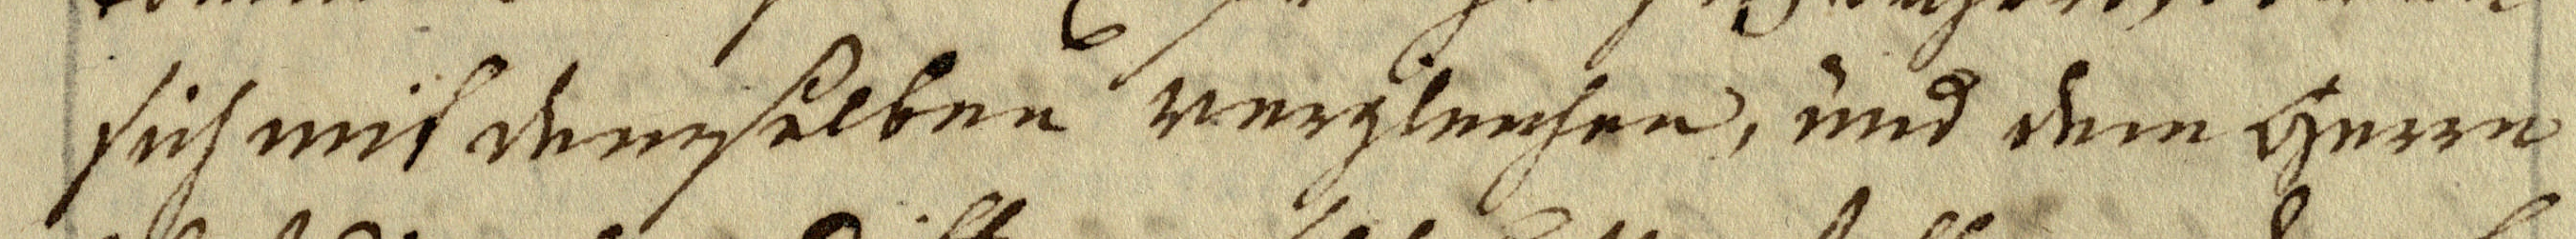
sich mit demselben vergleichen, und dem Herrn
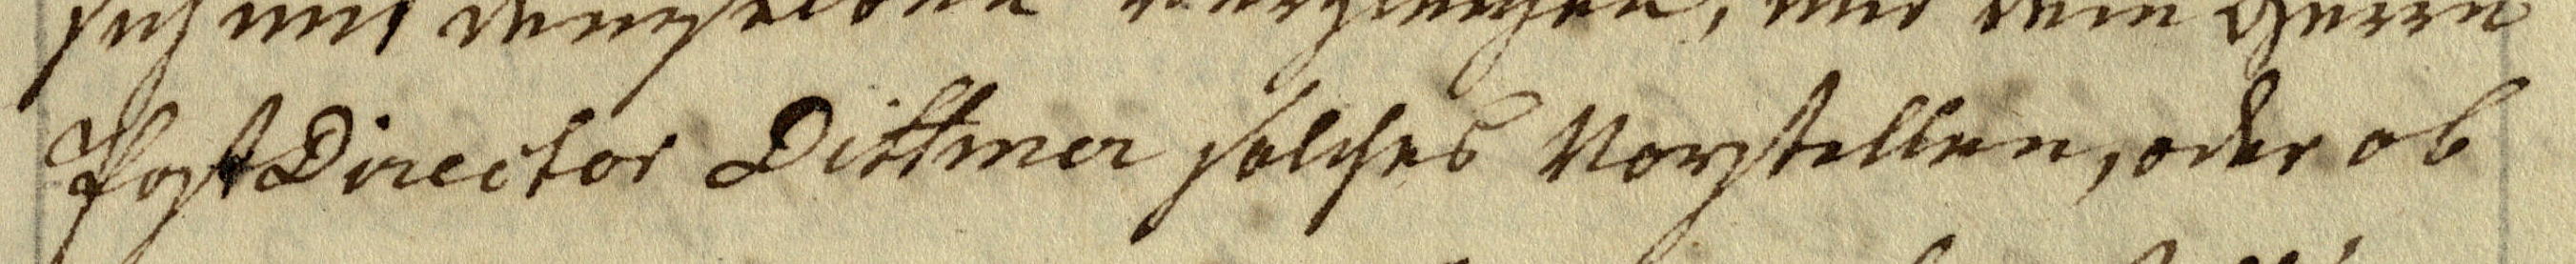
PostDirector Dittmer solches vorstellen, oder ob
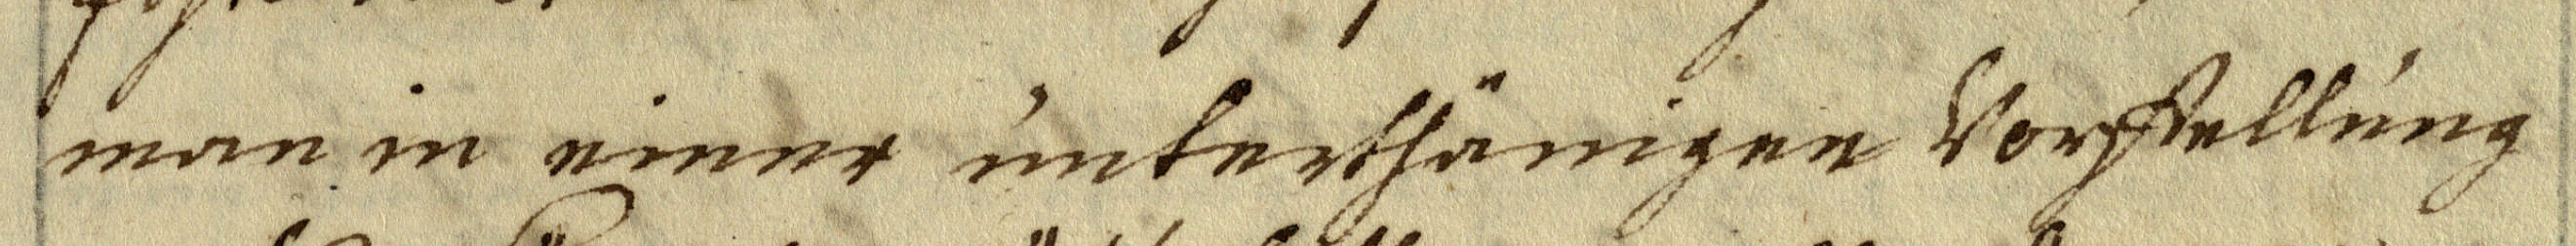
man in einer unterthänigen Vorstellung
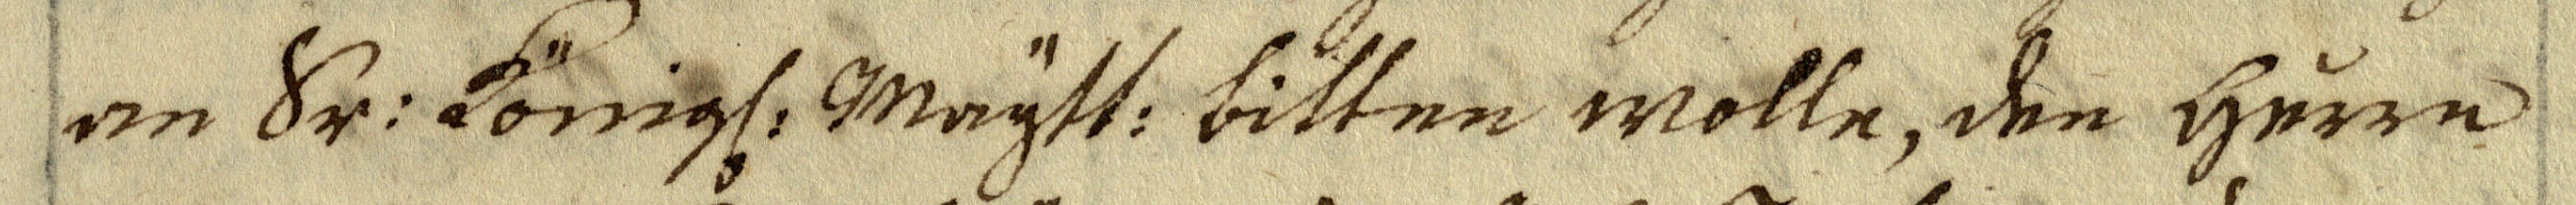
an Sr Königl. Maÿtt. bitten wolle, den Herrn
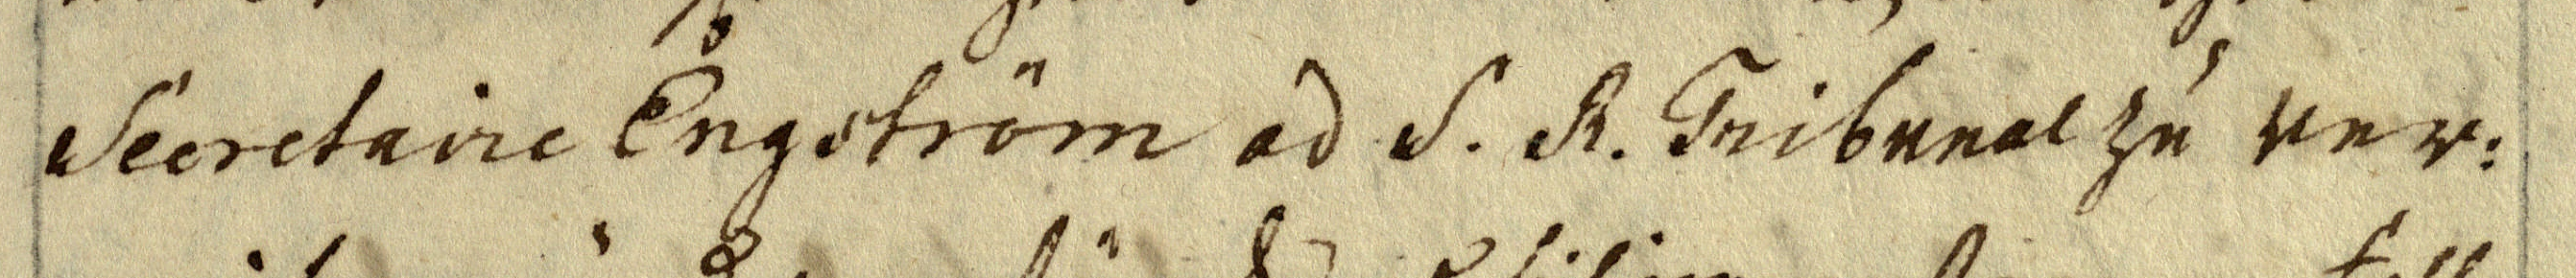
Secretaire Engström ad S. R. Tribunal zu ver¬
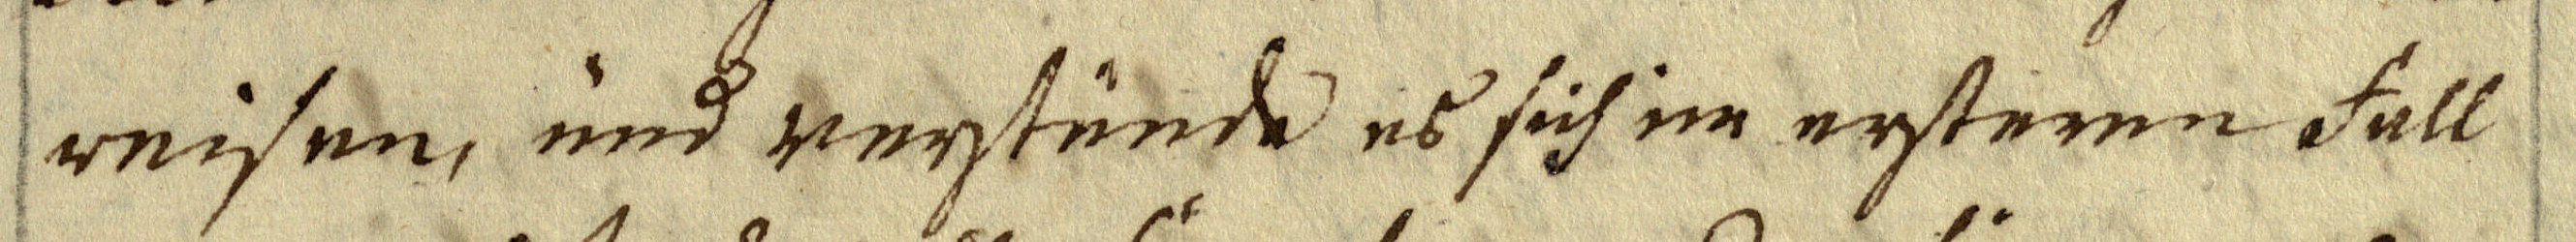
weisen, und verstünde es sich im ersteren Fall
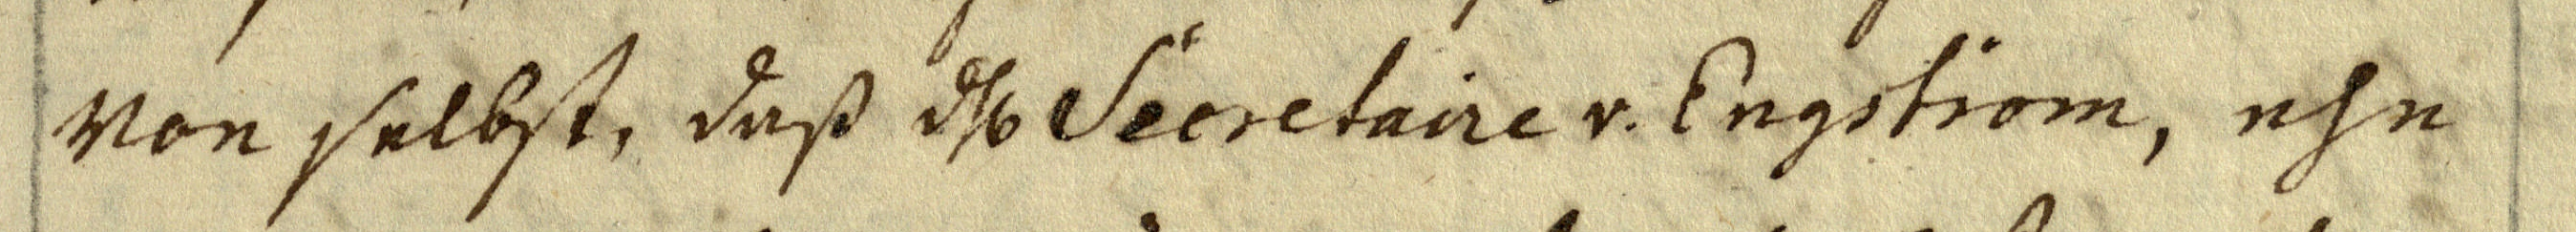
von selbst, daß dh Secretaire Engström, ehe
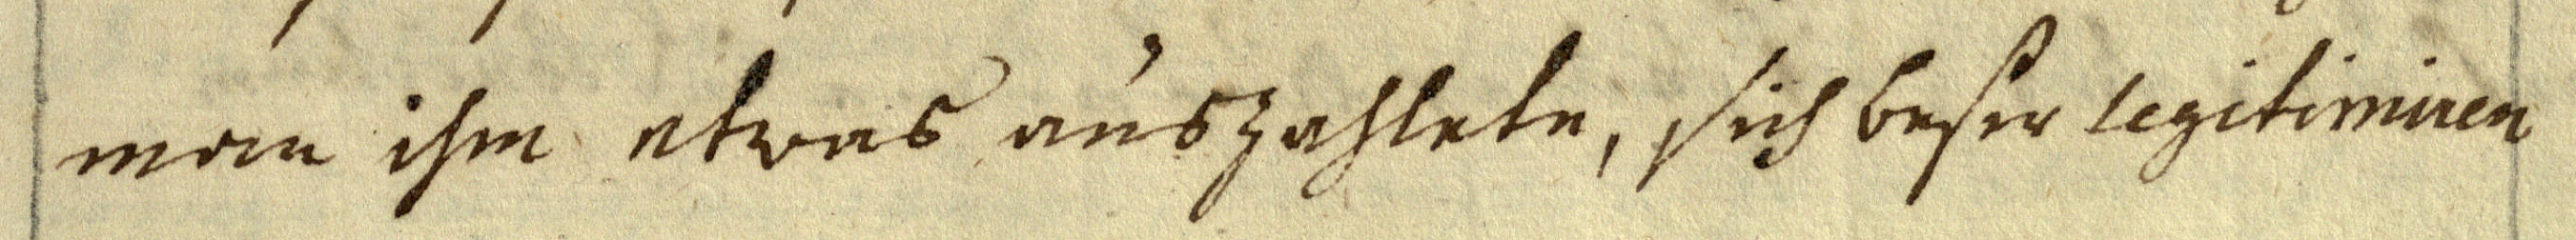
man ihm etwas auszahlete, sich beßer legitimiren
